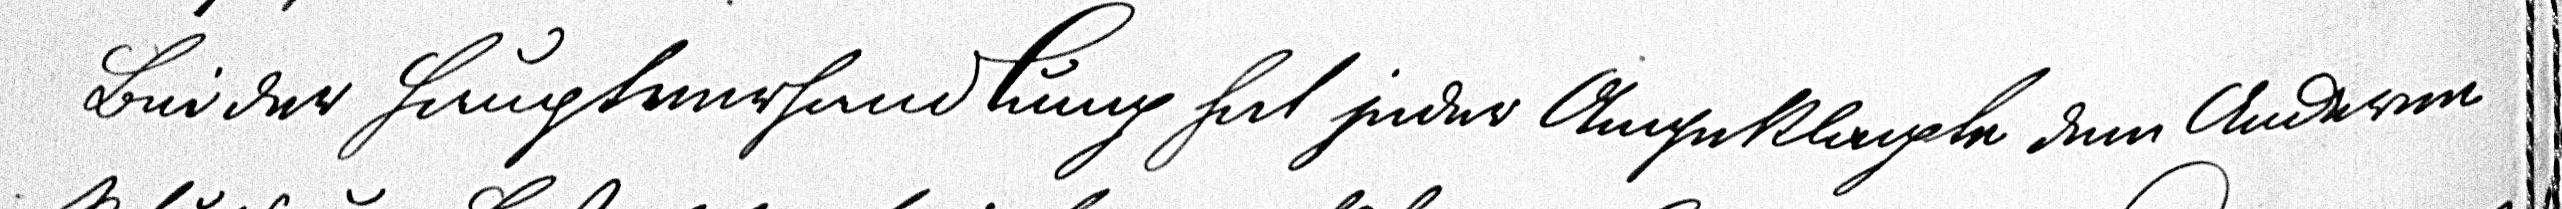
Bei der Hauptverhandlung hat jeder Angeklagte dem Anderen
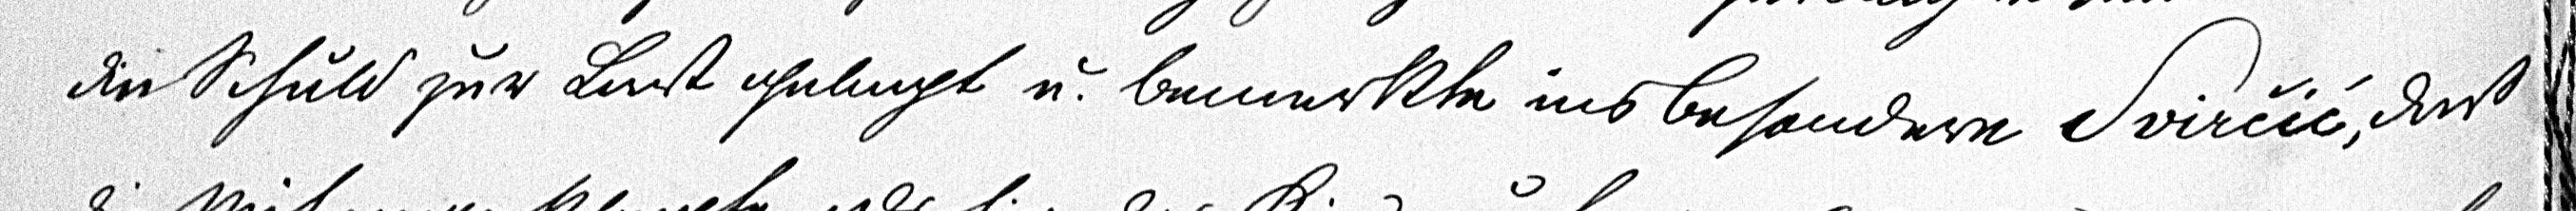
die Schuld zur Last gelegt u. bemerkte insbesondere Svirčić, daß
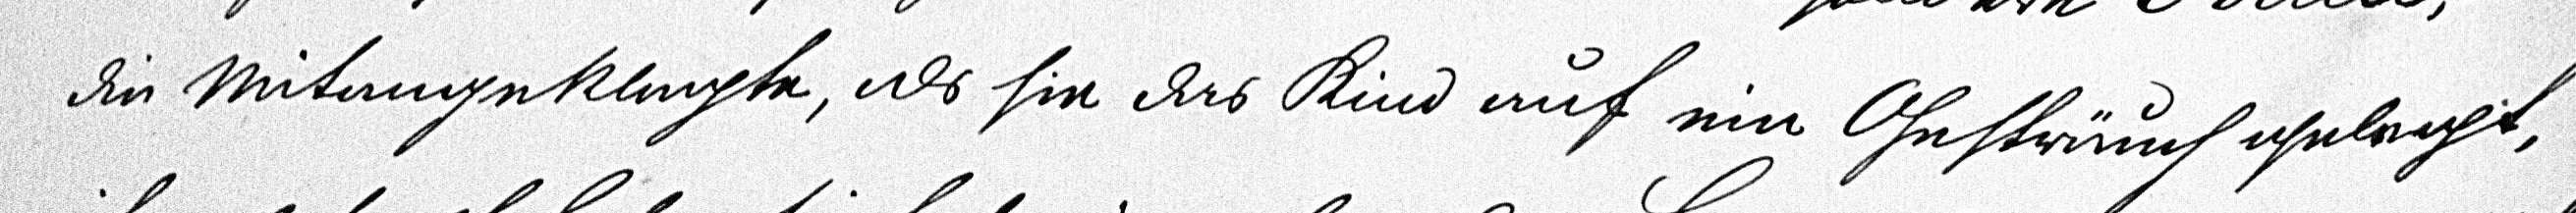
die Mitangeklagte, als sie das Kind auf ein Gestrauch gelegt,
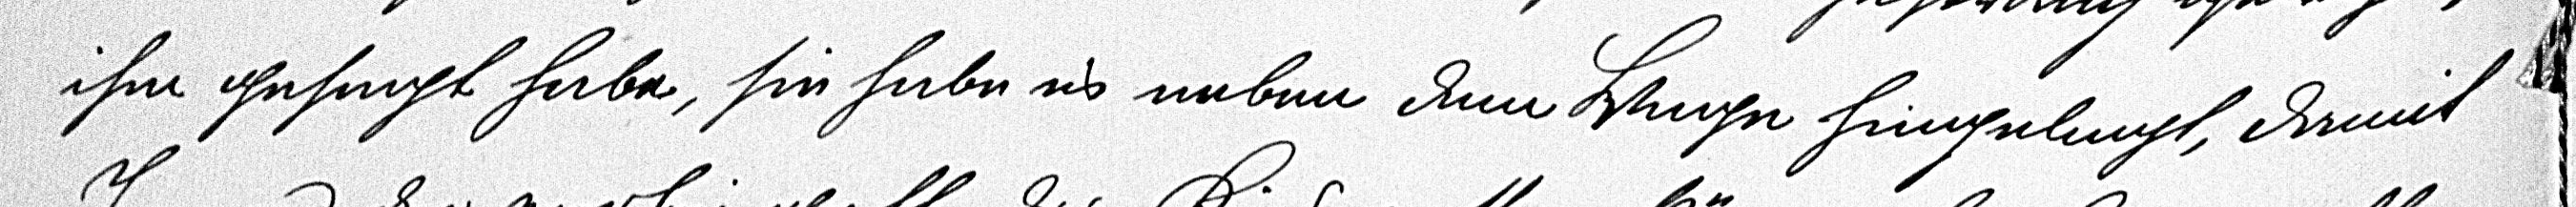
ihm gesagt habe, sie habe es neben dem Wage hingelegt, damit
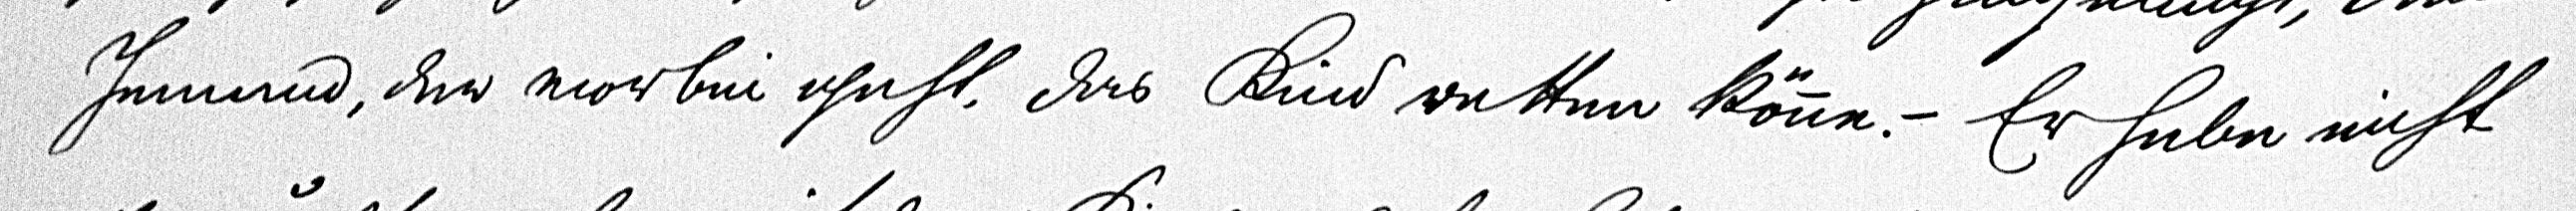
Jemand, der worbei geht, das Kind vetten könne.- Er habe nicht
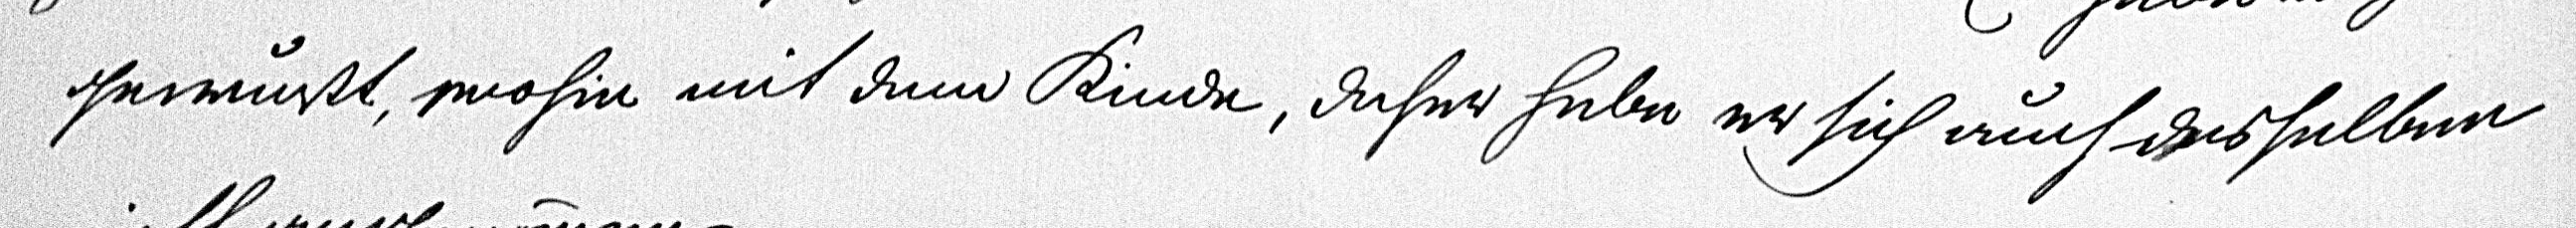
gewußt, wohin mit dem Kinde, daher habe er sich auch desselben
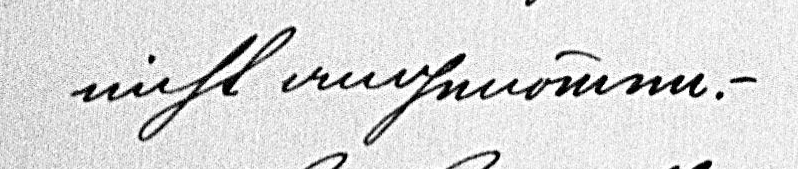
nicht angenommen.-
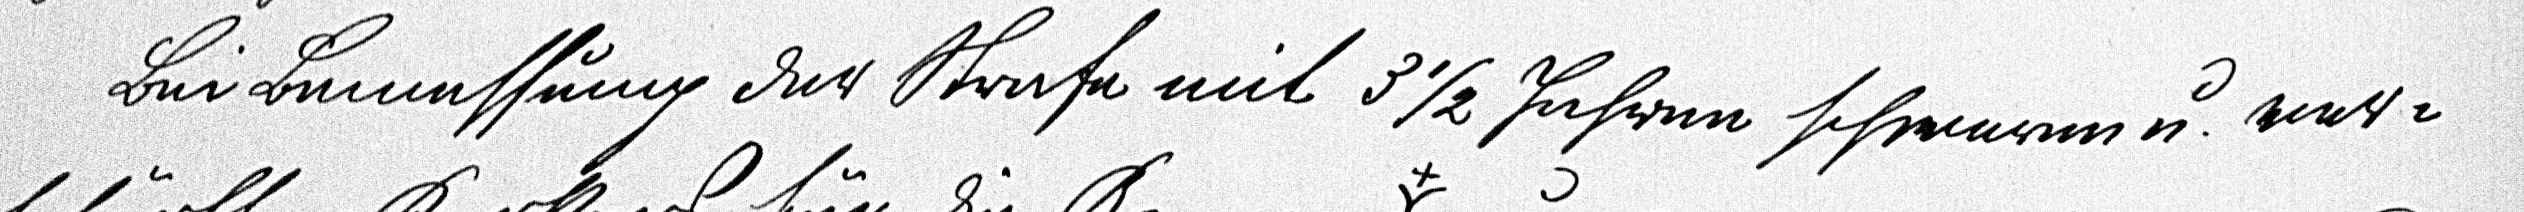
Bei Bemessung der Strafe mit 3 ½ Jahren schweren u. ver¬
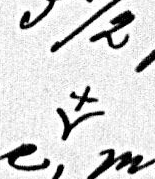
+
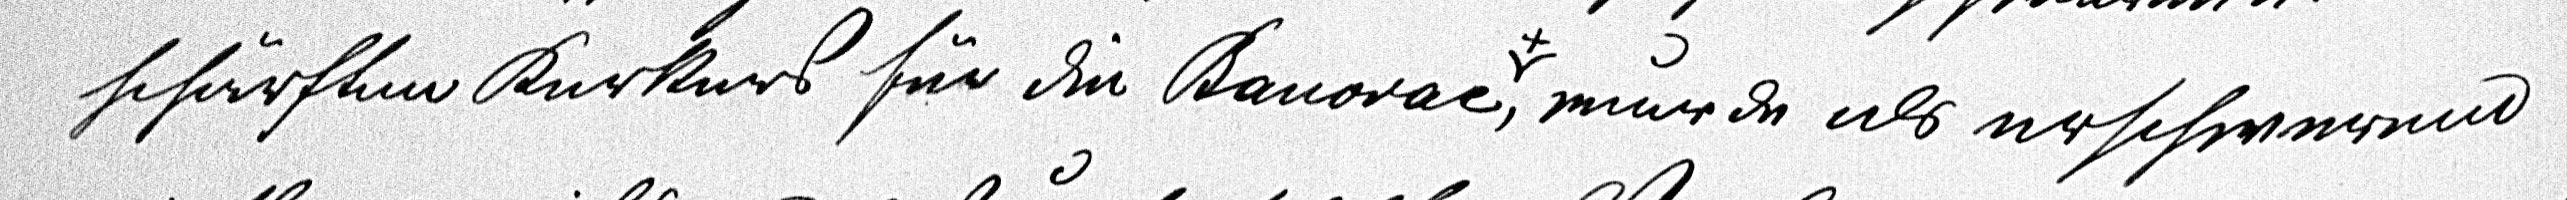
schärften Kerkers für die Banovac, wurde als erschwerend
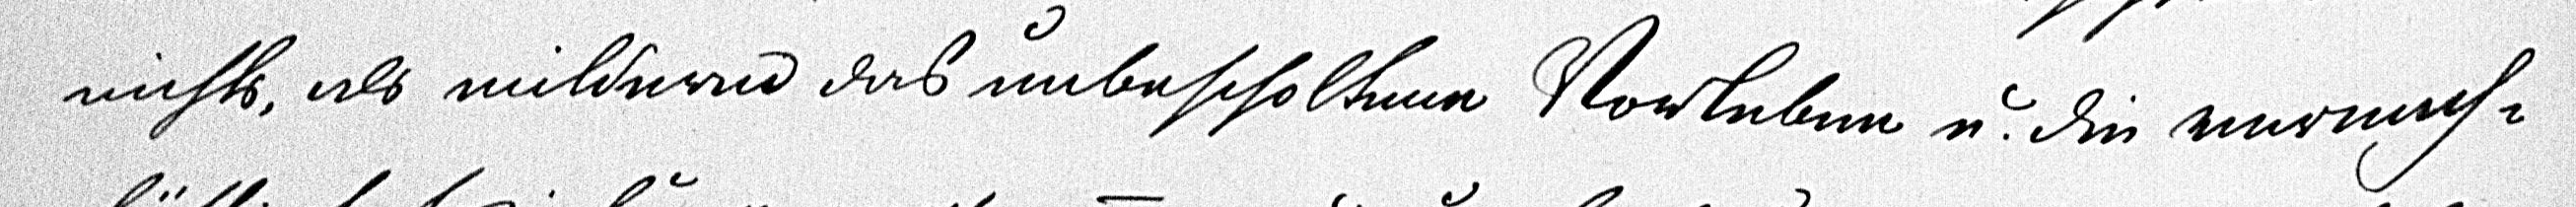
nichts, als mildernd das unbescholtene Vorleben u. die vernach¬
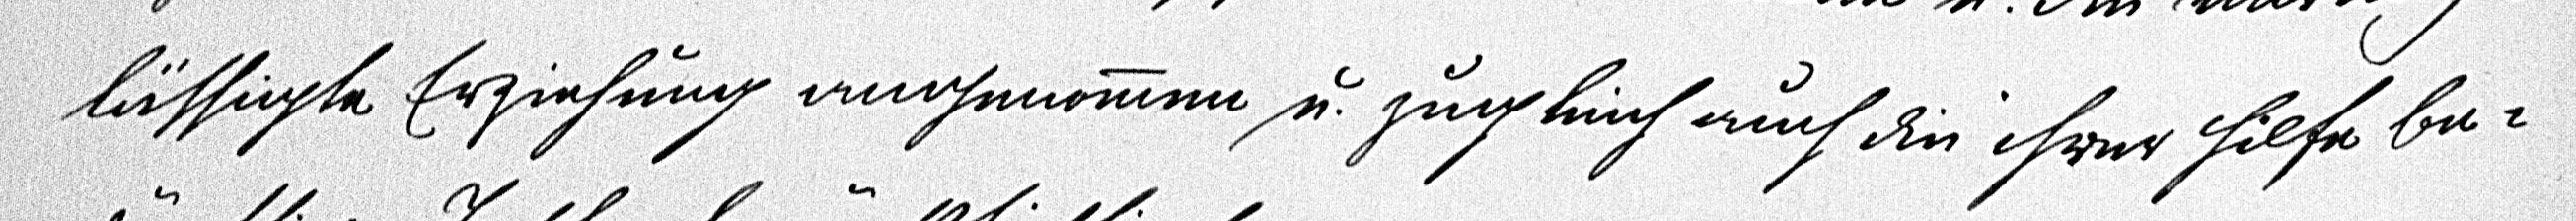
lässigte Erziehung angenommen u. zugleich auch die ihrer Hilfe be¬
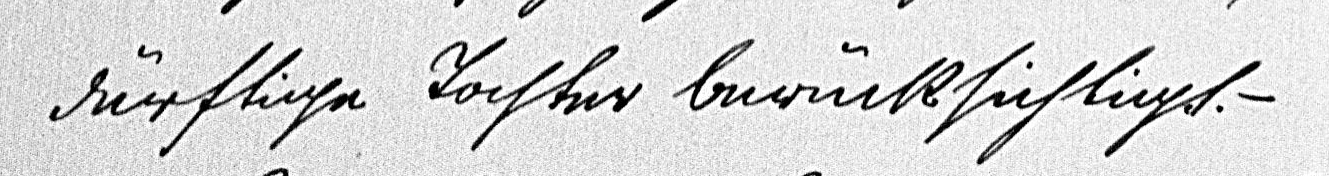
dürftige Tochter berücksichtigt.-
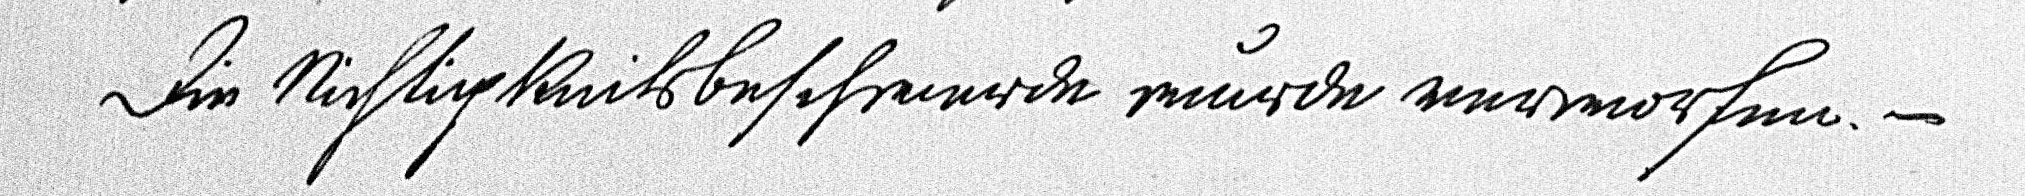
Die Nichtigkeitsbeschwerde wurde verworfen.-
